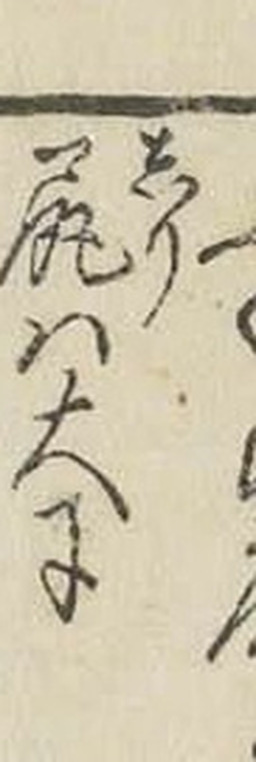尻は大に
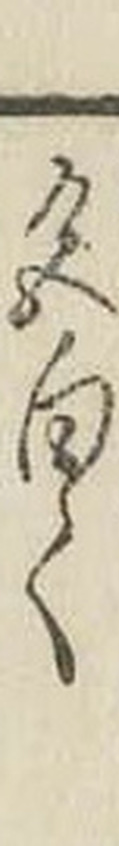色白く
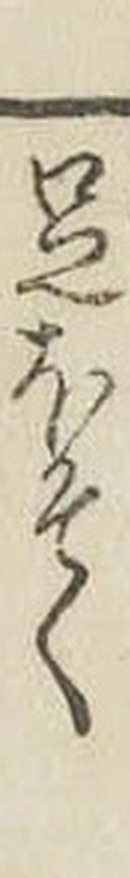足ほそく
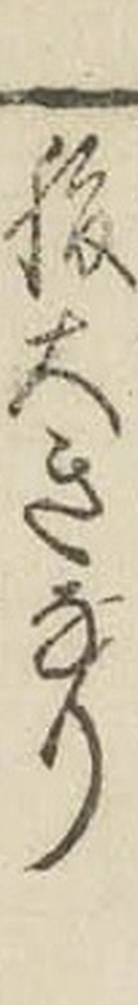腹大きなり
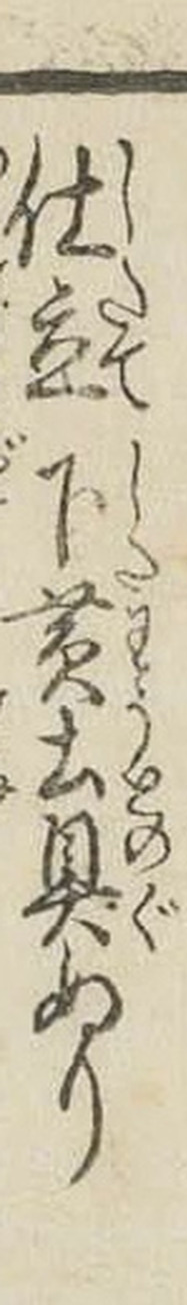仕立下黄土具ぬり
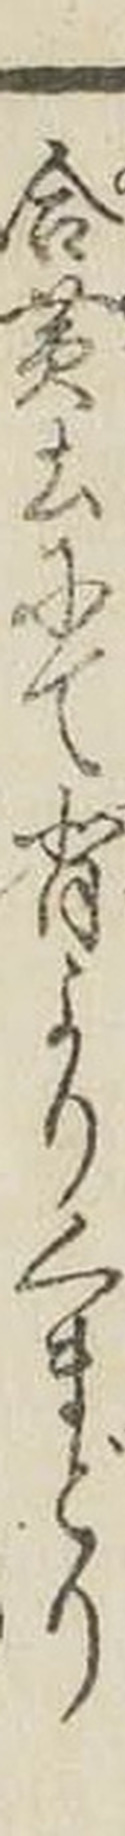合黄土にて背よりくまどり
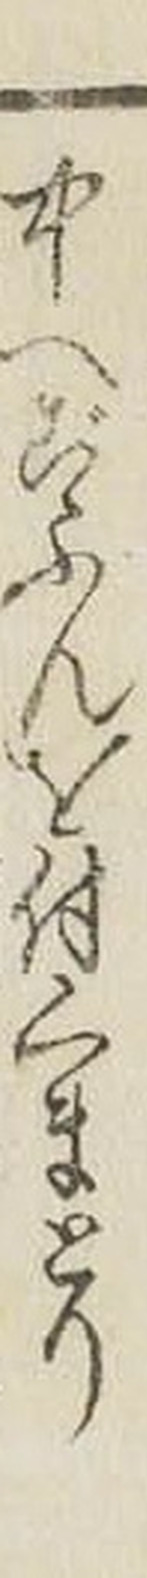中へごふんを付くまとり
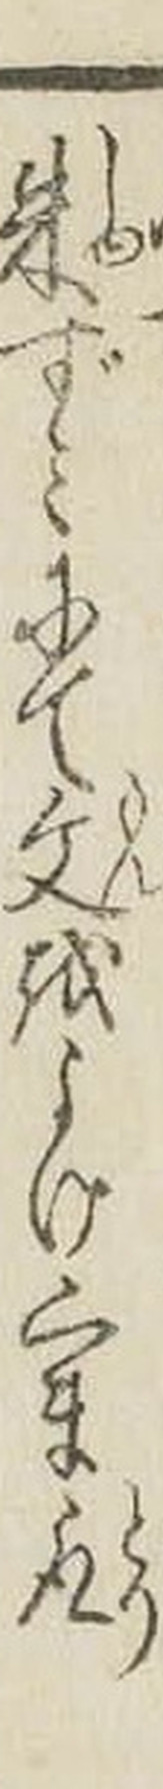朱ずみにて文をよけくま取
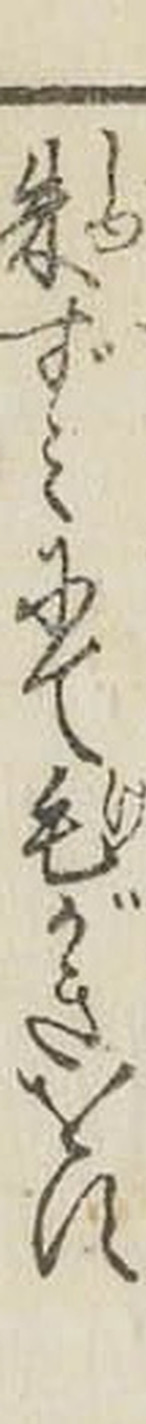朱ずみにて毛がきをす
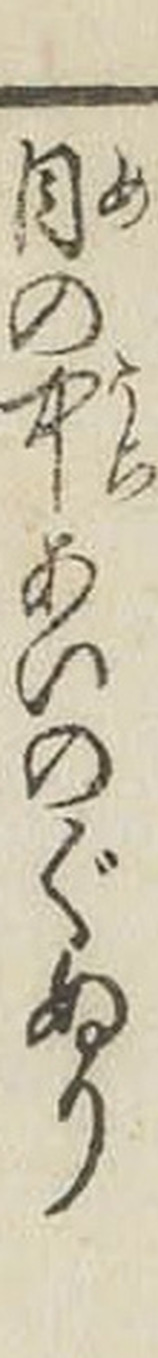目の中あいのぐぬり
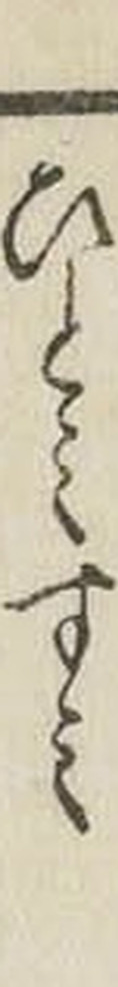ひとみすみ
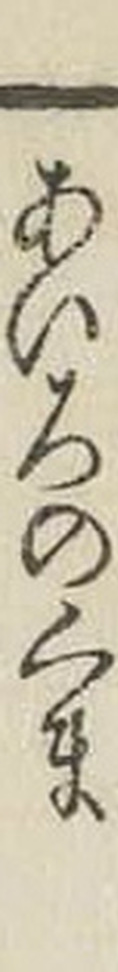あいろのくま
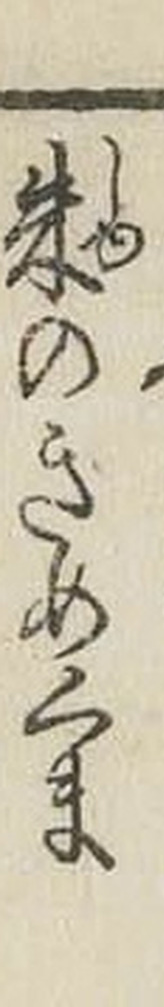朱のきめくま
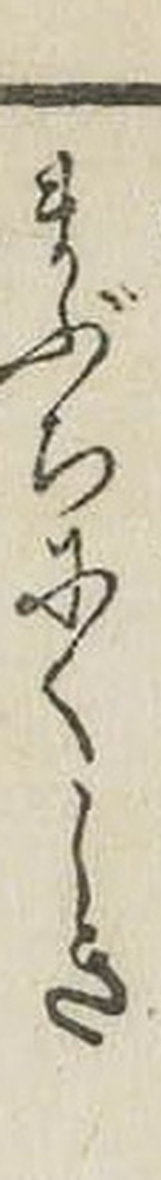まぶちにくしき
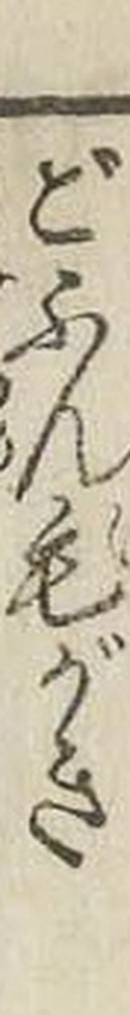ごふん毛がき
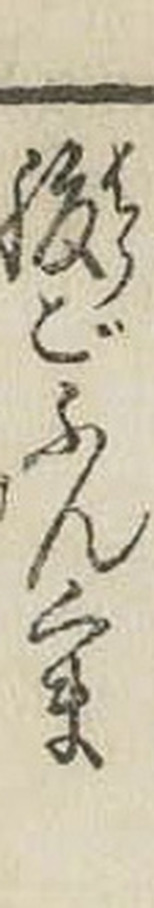腹ごふんくま
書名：絵本写宝袋 9巻 9之巻下
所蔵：東京学芸大学教育コンテンツアーカイブ
